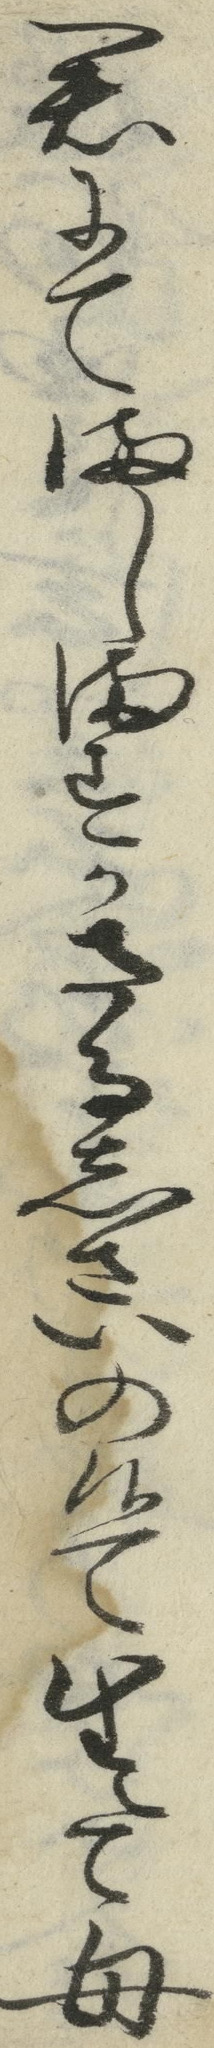君にてましますかさるしさいの候て生レて母
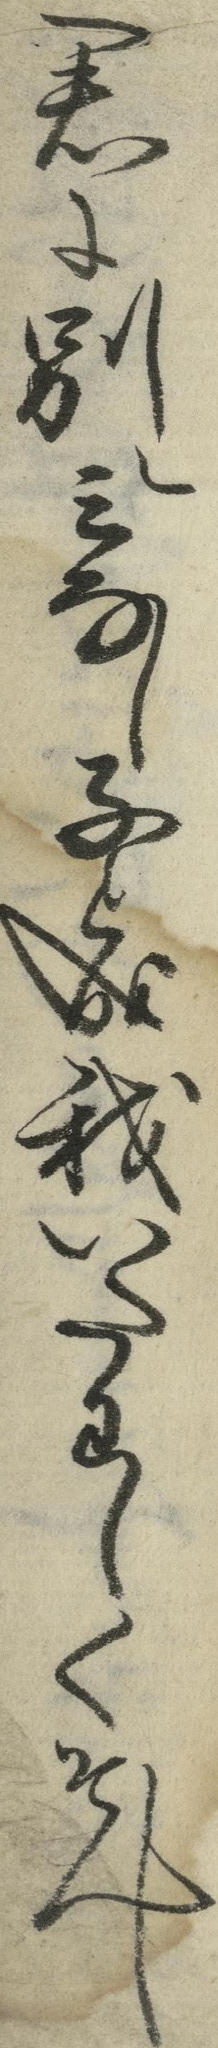君に別レみなし子と成我いたわしくそんし

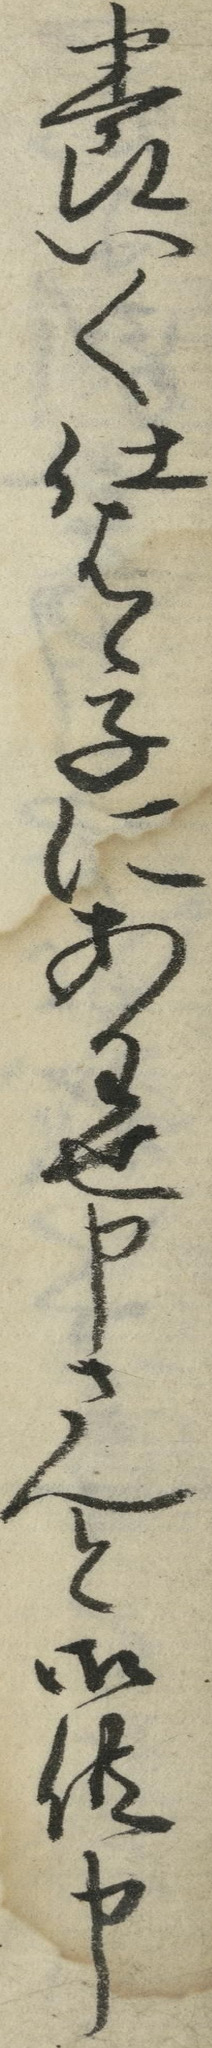養いく仕はゝ子にあわせ申さんと御供申
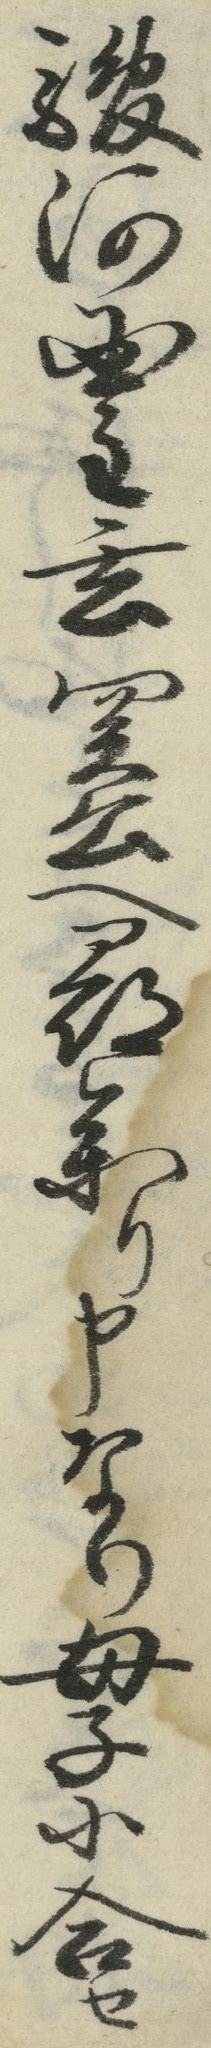駿河国主玄関公へ尋参リ申なり母子に合せ
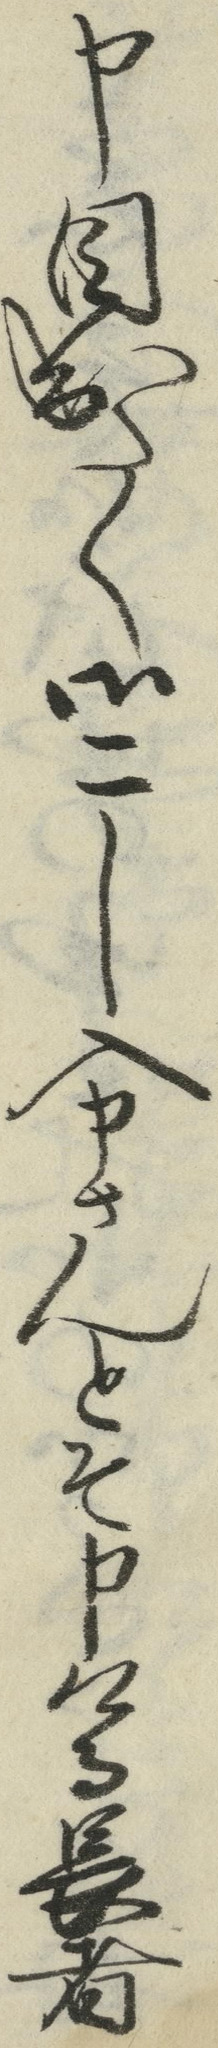申目出たく御こし入申さんとそ申ける長者
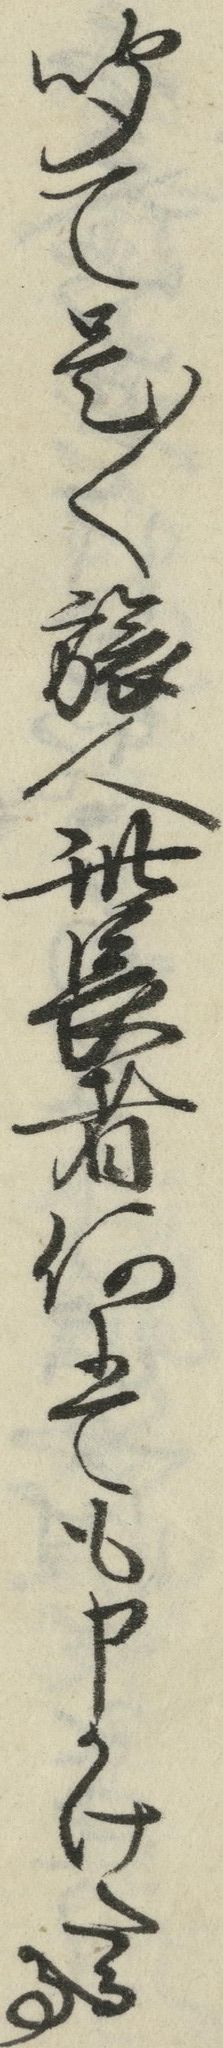聞て是〳〵旅人此長者何にても申かけたる事
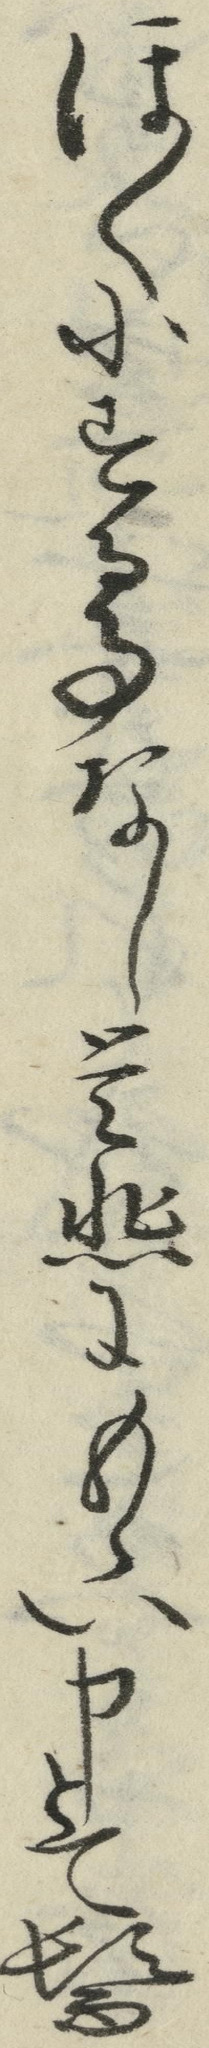ほくにする事なし是悲にもらい申とて頓而
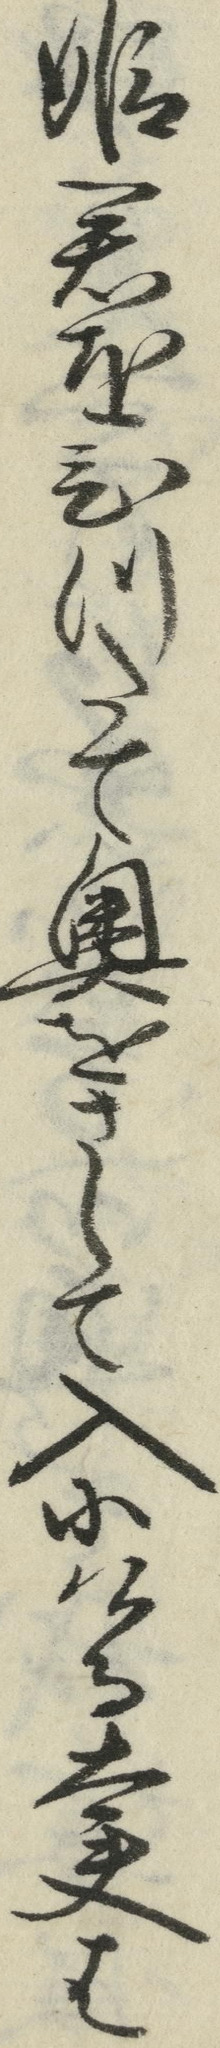姫君をひつたて奥をさして入にける太夫は
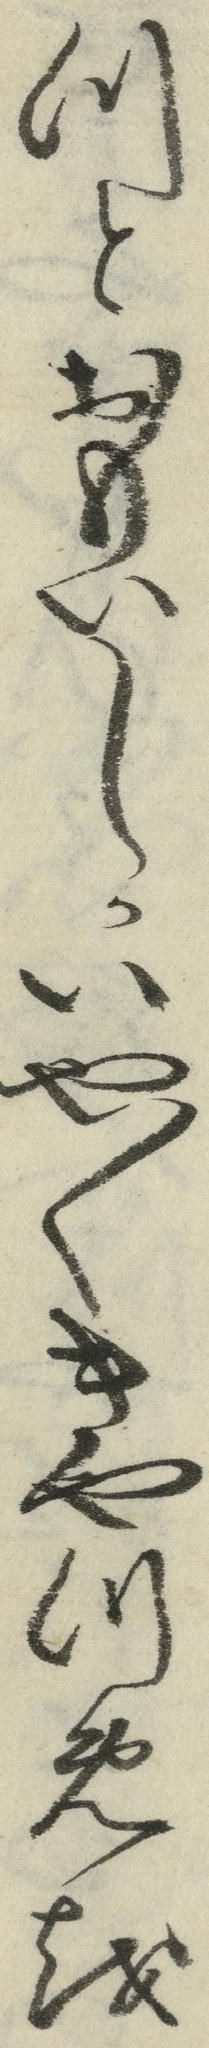つとおもいしかいや〳〵きやつめを
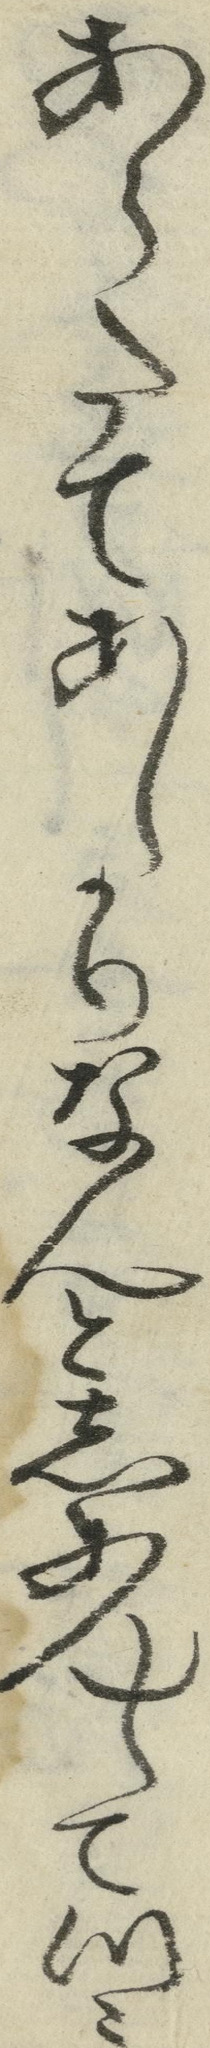あらたてあしかりなんとしあんしてつ〻
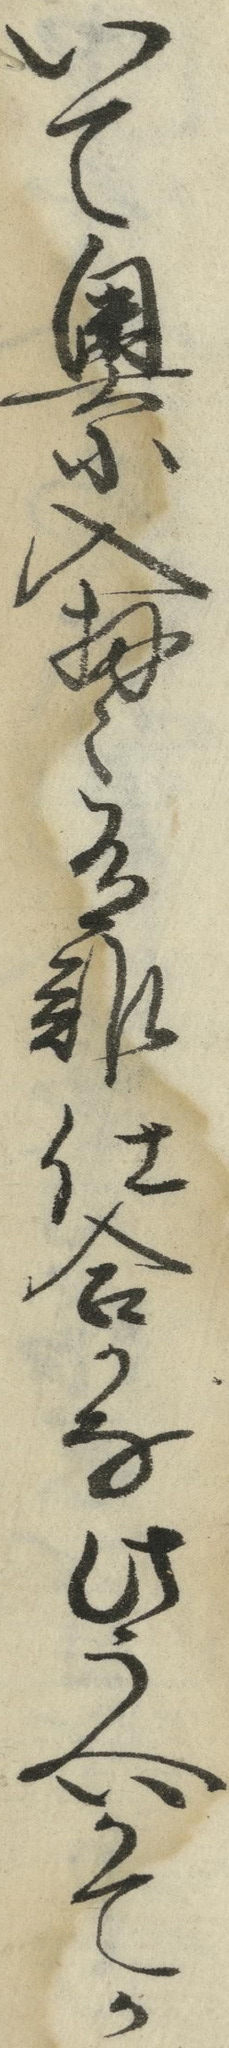いて奥に入扨ゝ有難仕合かな此うへいかてか
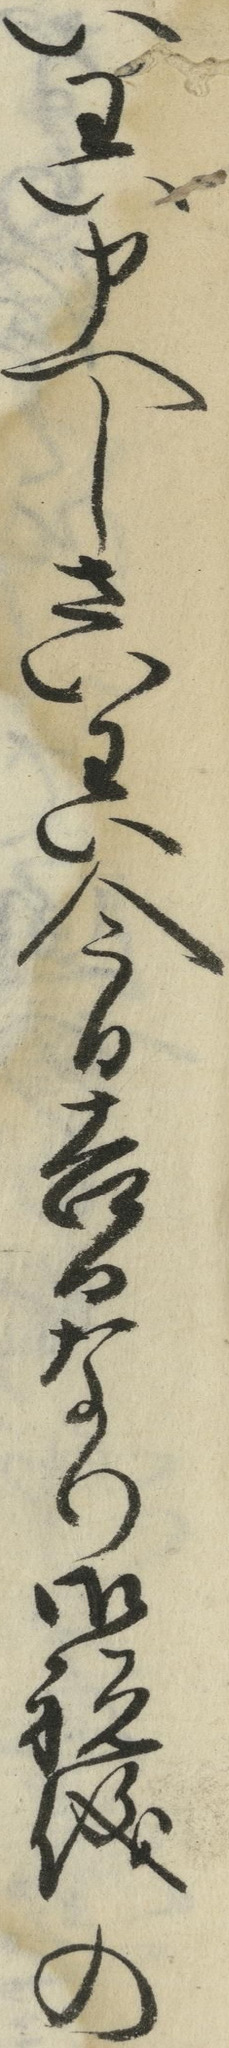いわい申へしさいわい今日吉日なり御祝儀の
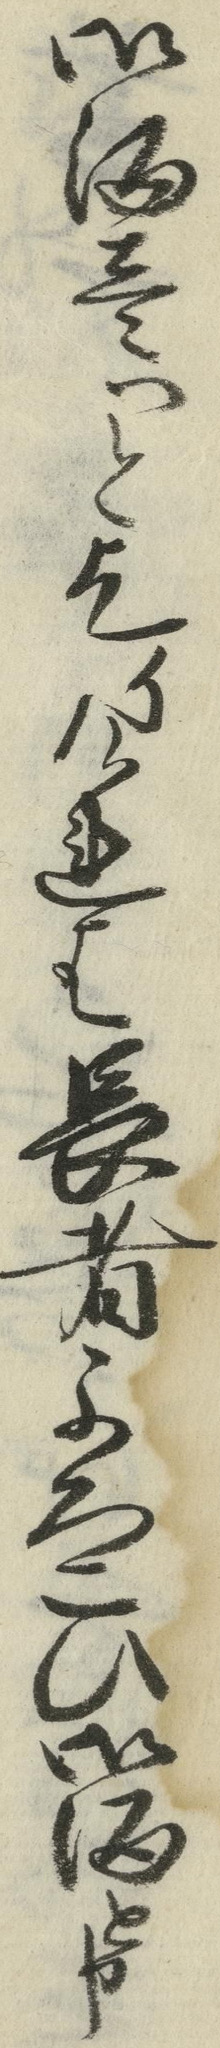御酒壱つと乞イけれは長者よろこひ御酒と申
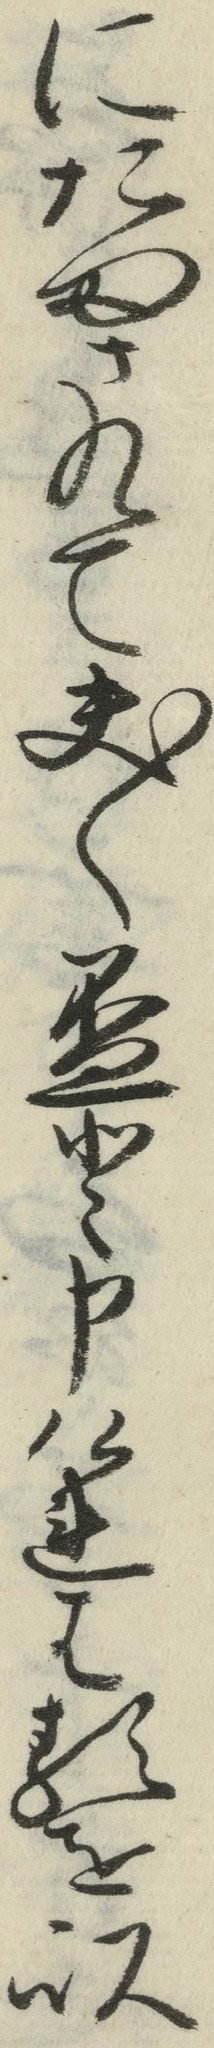にたまされて夫ゝ盃と申けれは類を以
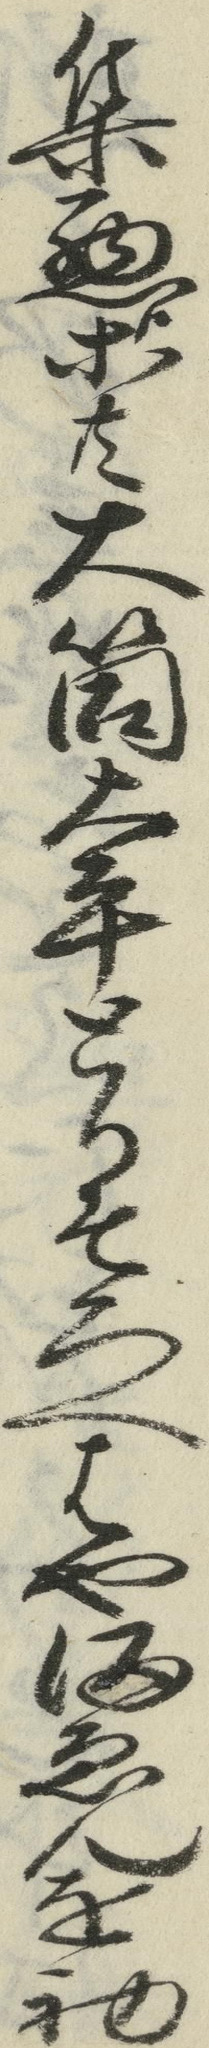集悪等共大箇大平とりそろへはや酒ゑんを初
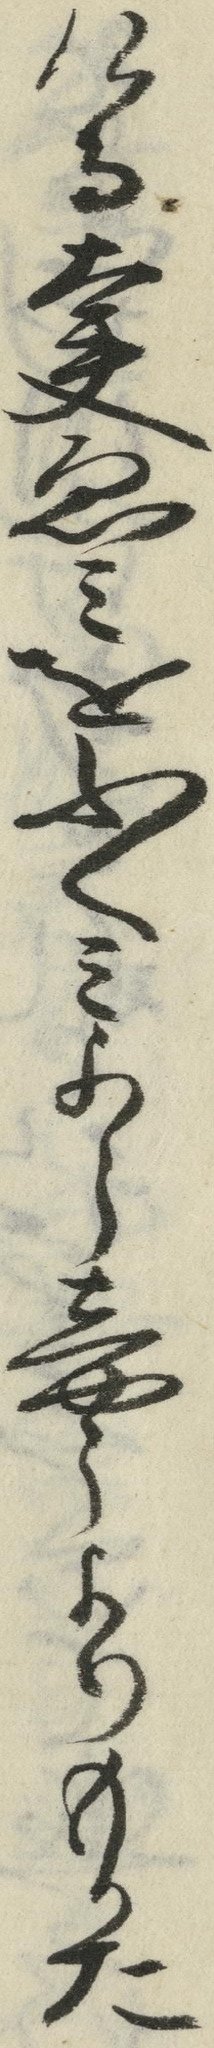ける太夫ゑミをふくミようしやうよりもりた
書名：浅間記
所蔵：東京大学地震研究所図書室 Earthquake Research Institute Library, The University of Tokyo, JAPAN
